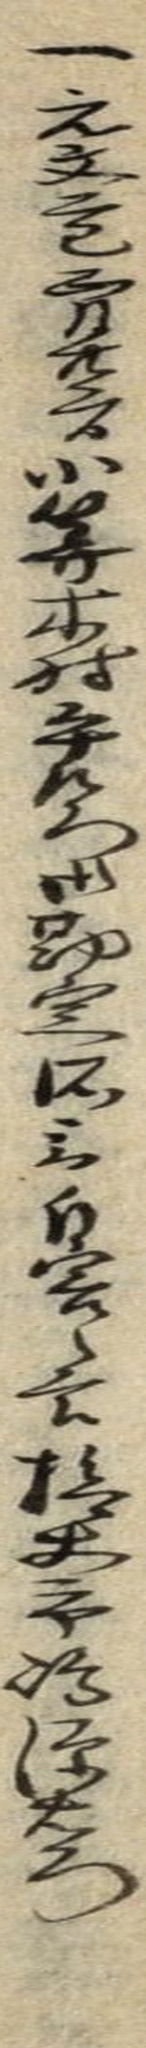一元文二巳正月廿二日小算木村平左衛門御勘定所にて自害之節検使市島源右衛門
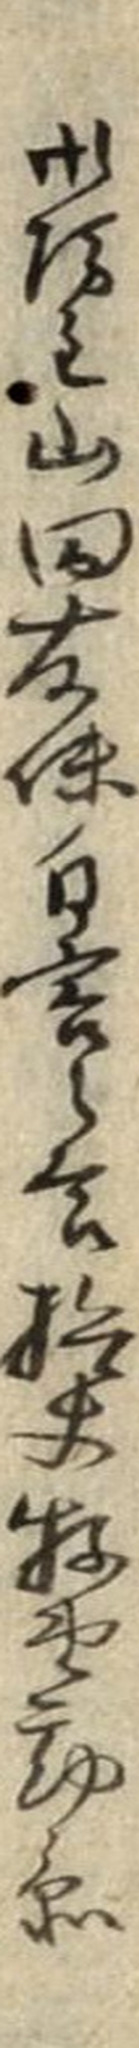御坊主山田友咊自害之節検使牧野勘兵衛
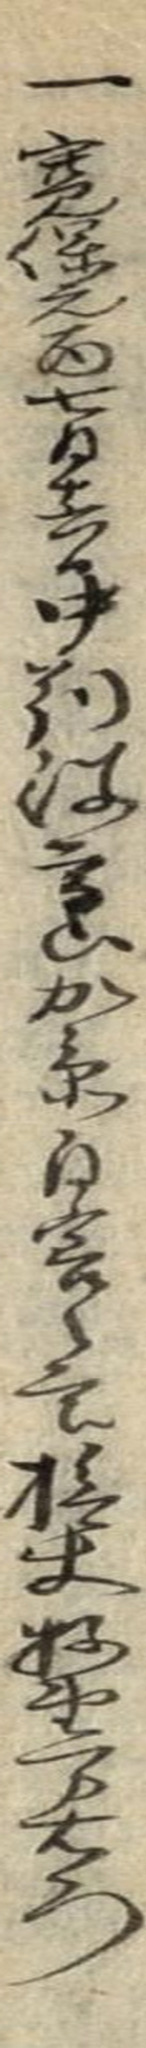一寛保元酉七月十六日中判役高山加兵衛自害之節検使牧野万右衛門
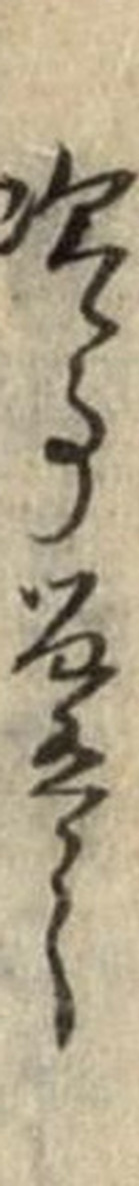次候事留有之
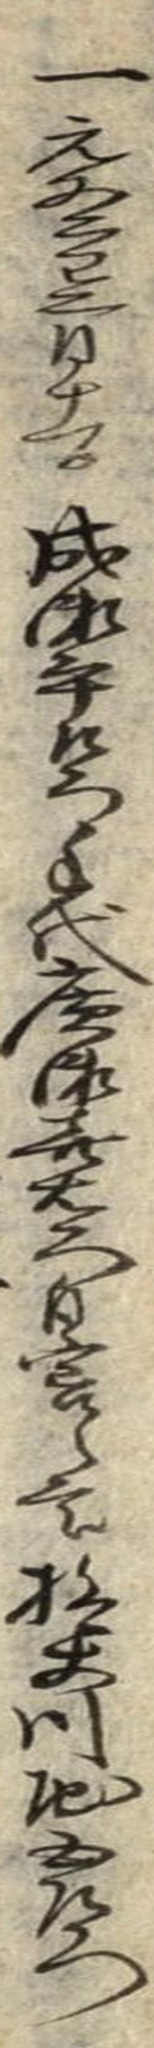一元文二巳二月十一日成瀬平左衛門手代広瀬喜右衛門自害之節検使川地五左衛門
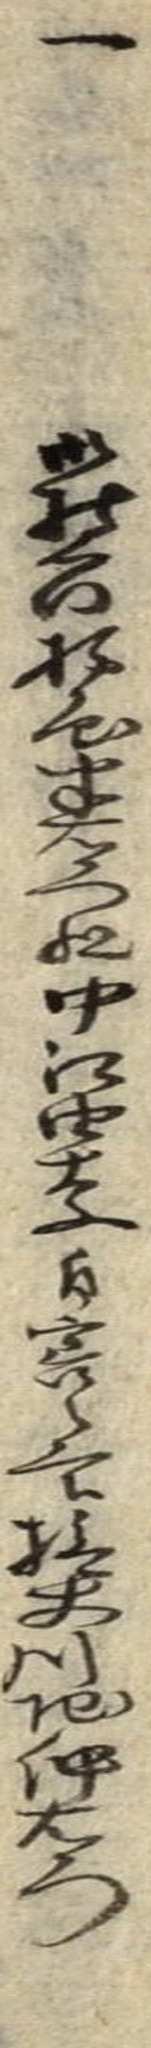御持筒栃屋半右衛門組中江由大夫自害之節検使川地仲右衛門
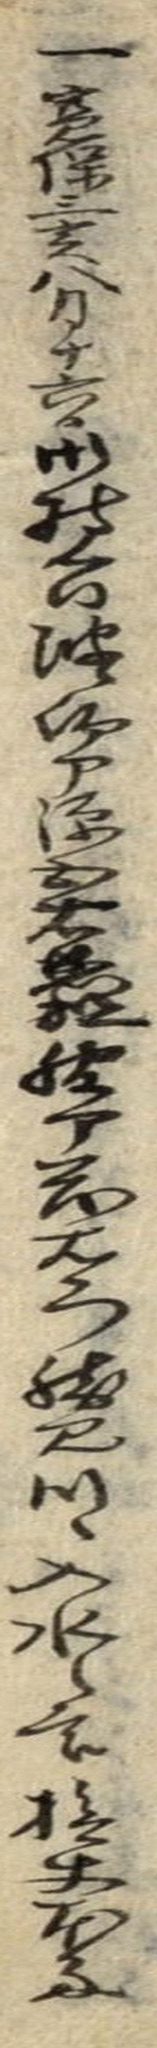一享保三亥八月十六日御持筒波々伯部源五右衛門組服部茂右衛門勝見川へ入水之節検使本多
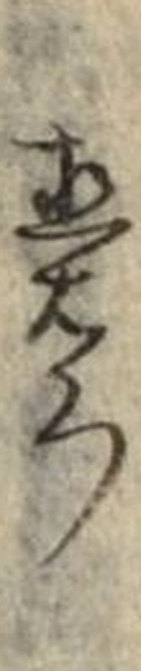直右衛門
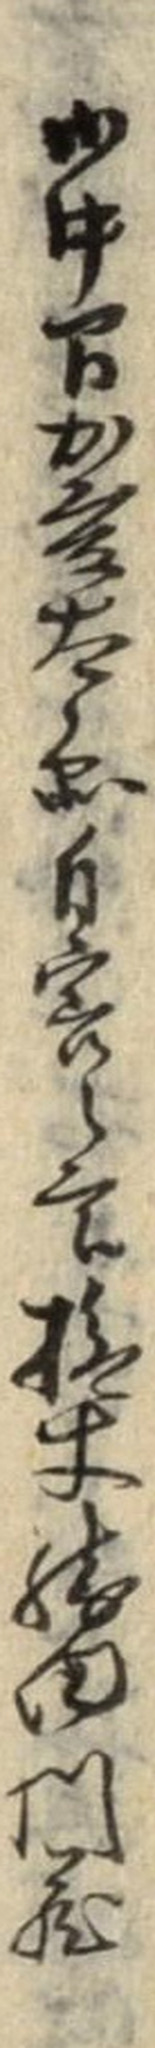一御中間加藤太兵衛自害之節検使勝田門蔵

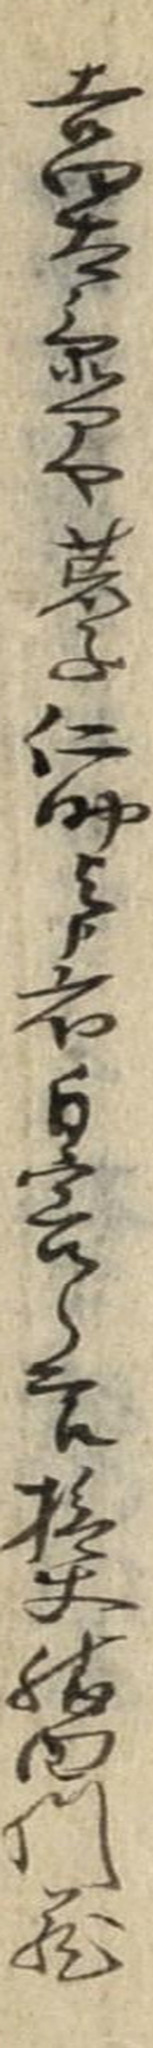一吉田太兵衛部や荒子仁助と申者自害之節検使勝田門蔵
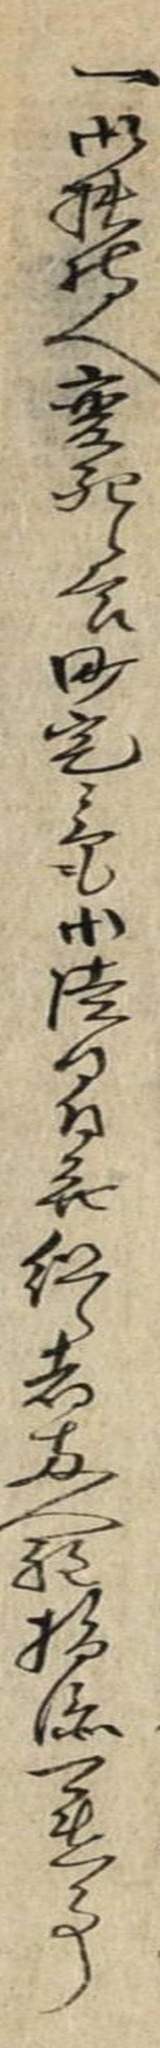一御扶持人変死之節町宅にても御徒目付并組之者両人程指添可遣事
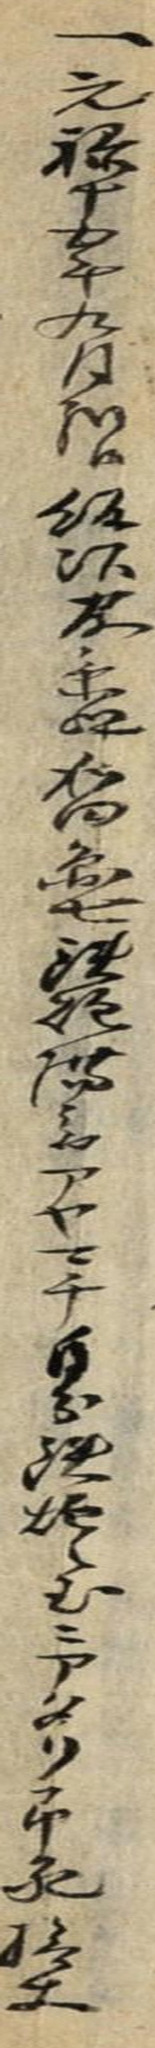一元禄十五午九月朔日飯沼官兵衛組和田円七鉄炮場にてアヤマチ自分鉄炮之玉にアタリ即死検使
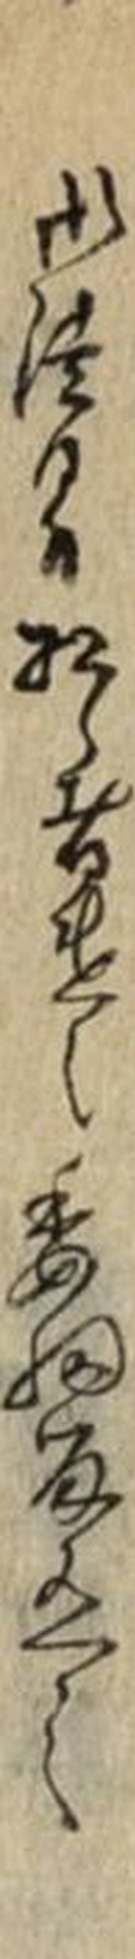御徒目付組之者遣之委細留有之
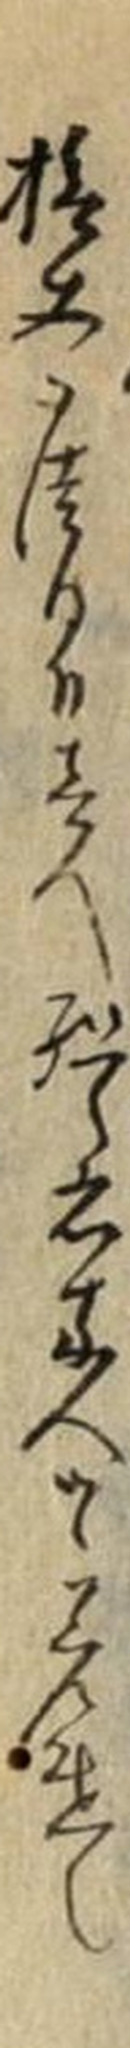検使御徒目付壱人組之者両人ツヽ差遣之
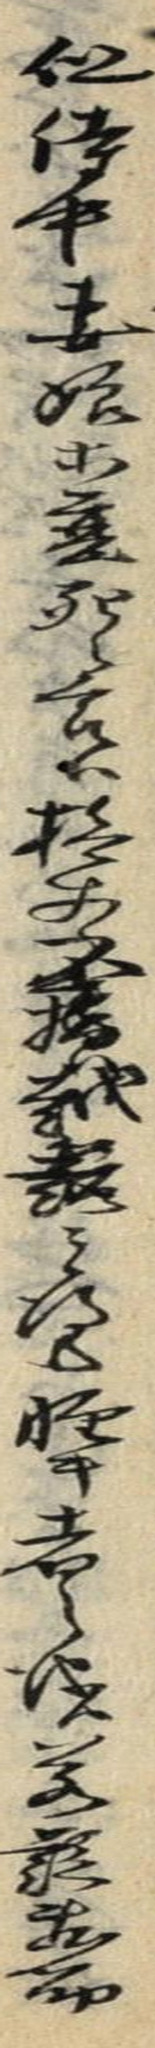但侍中妻娘等変死之節は検使不指越趣に候得共軽キ者之儀は若疑敷筋
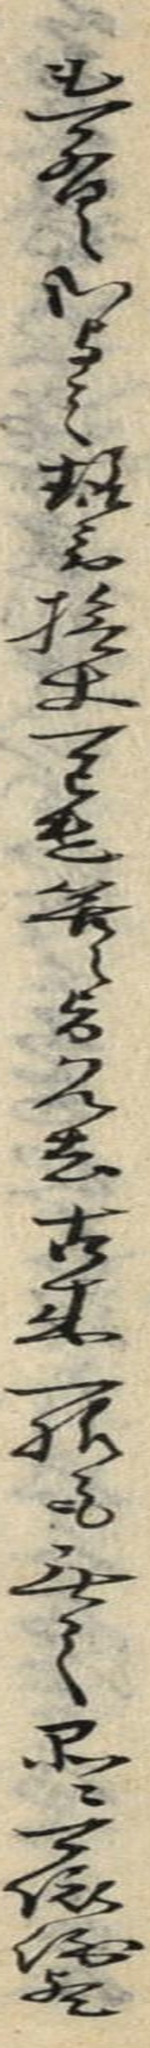も可有之哉と之趣にて検使可被遣筈之旨乍去古来一様にも無之品に可依儀歟
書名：御停止異変死失
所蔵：福井県文書館 Fukui Prefectural Archives
